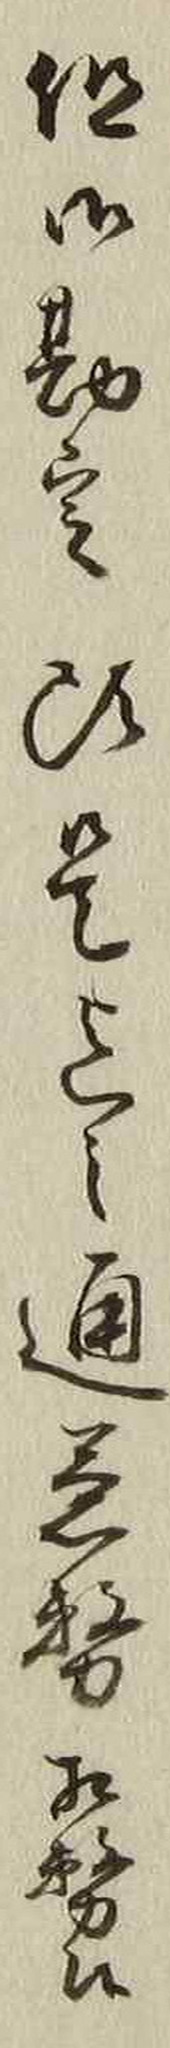但御勘定頭是迄之通兼務相務候
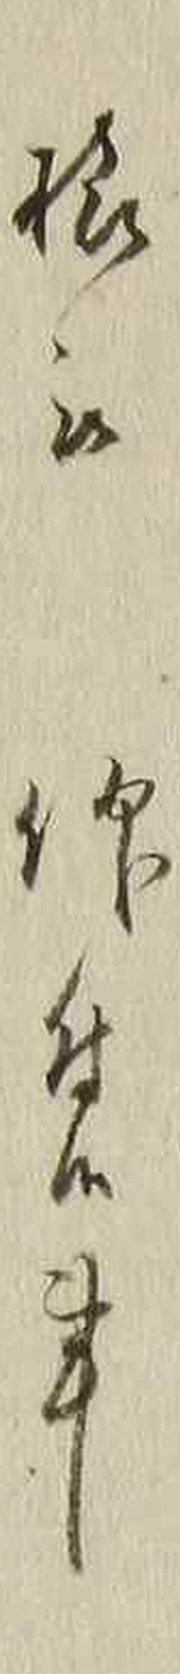様被仰付候事
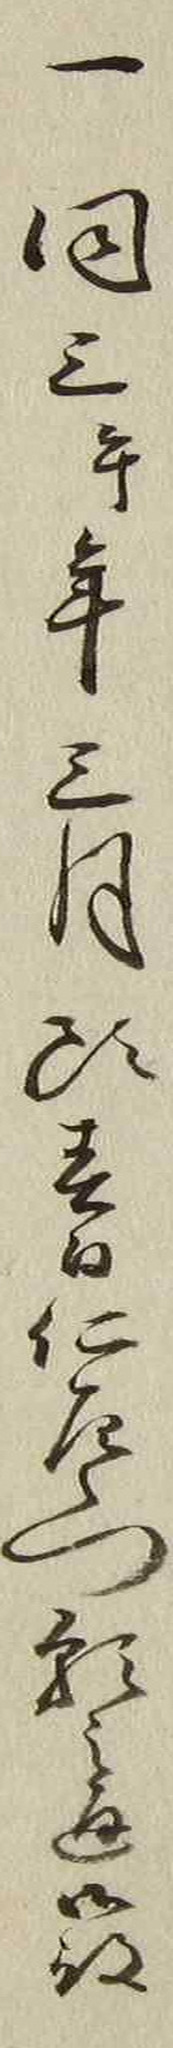一同三午年三月頭春日仁左衛門願之通御役
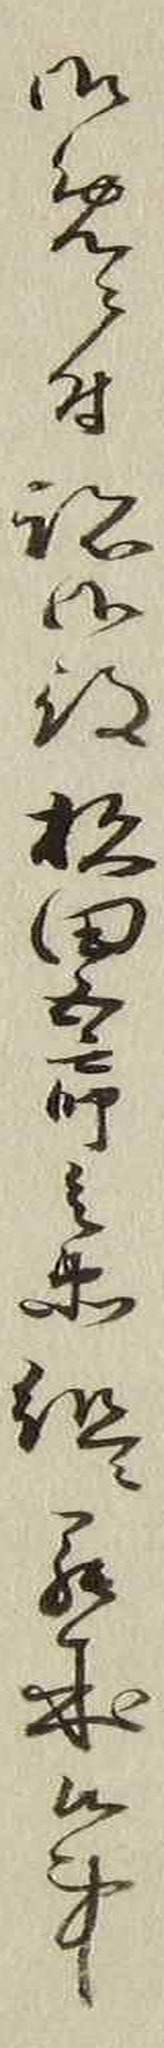御免ニ付跡御役杉田五郎兵衛組ニ罷成候事
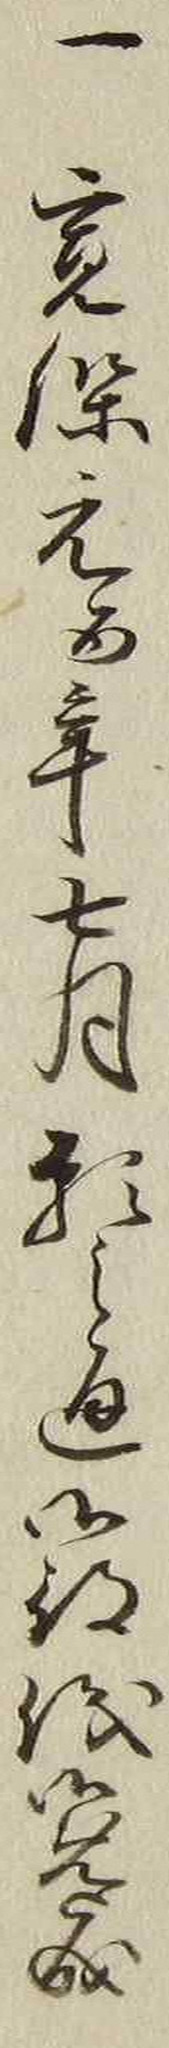一寛保元酉年七月願之通御役儀御免被成
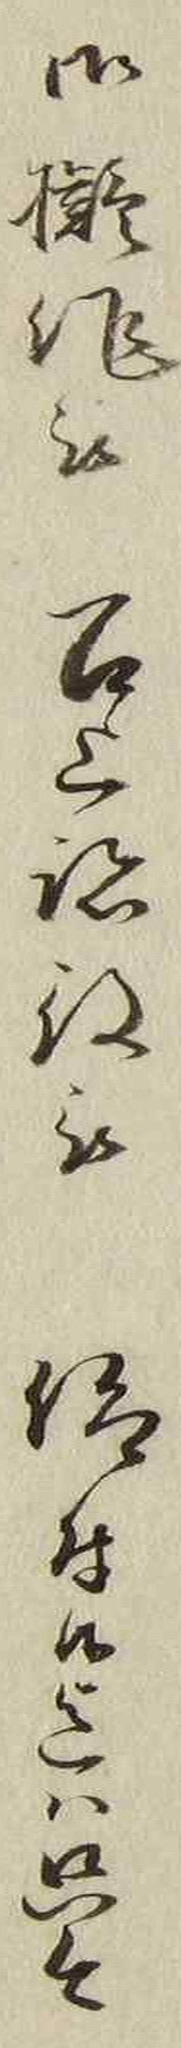御擬作被召上跡役被仰付候迄ハ只今
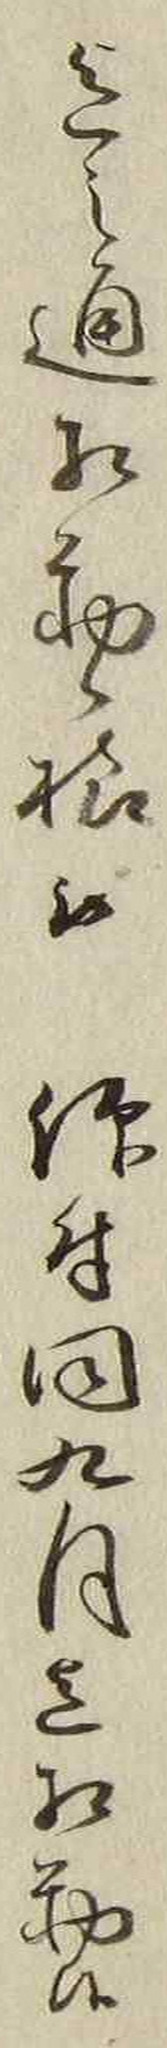迄之通相勤候様被仰付同九月迄相勤候

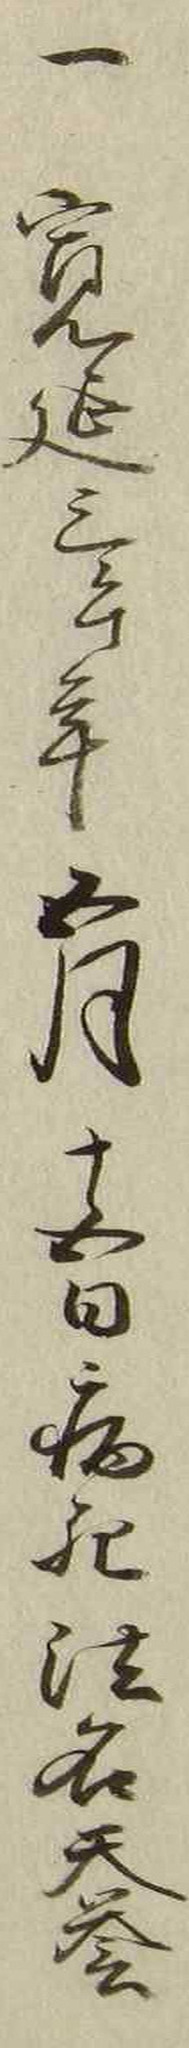一寛延三午年五月十五日病死法名天誉
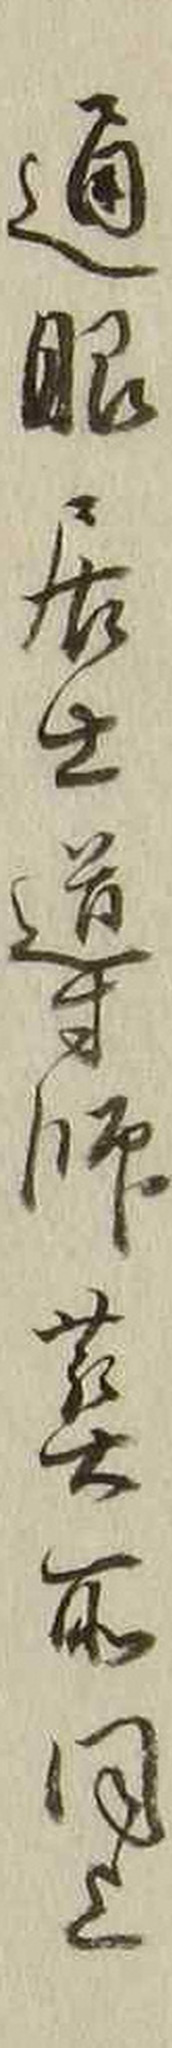通眼居士導師葬所同上
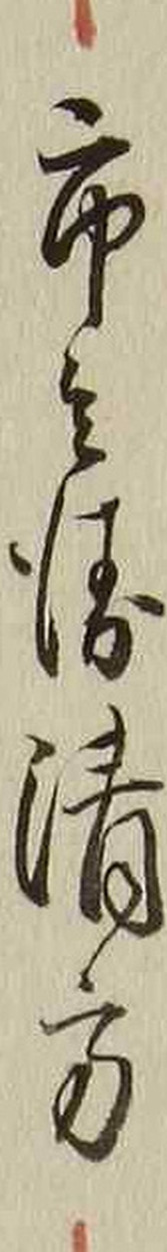市兵衛清方
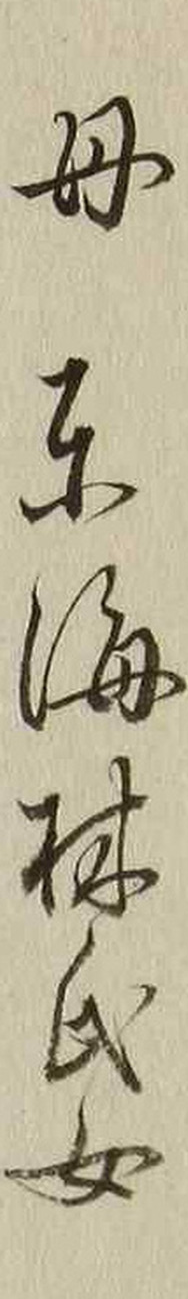母東海林氏女
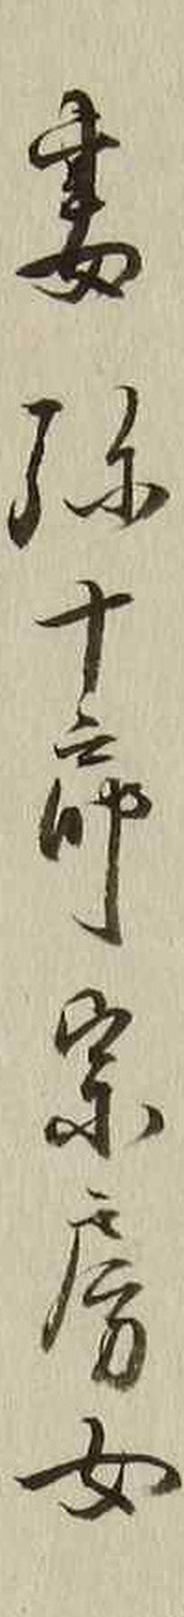妻弥十郎宗房女
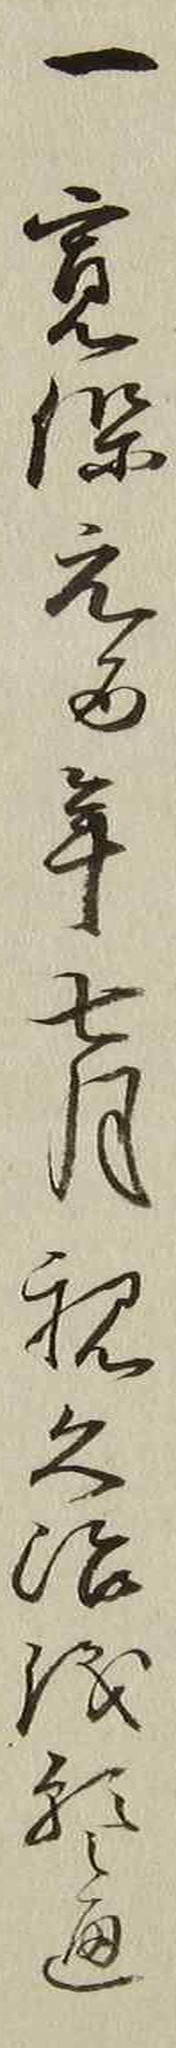一寛保元酉年七月親久治儀願之通
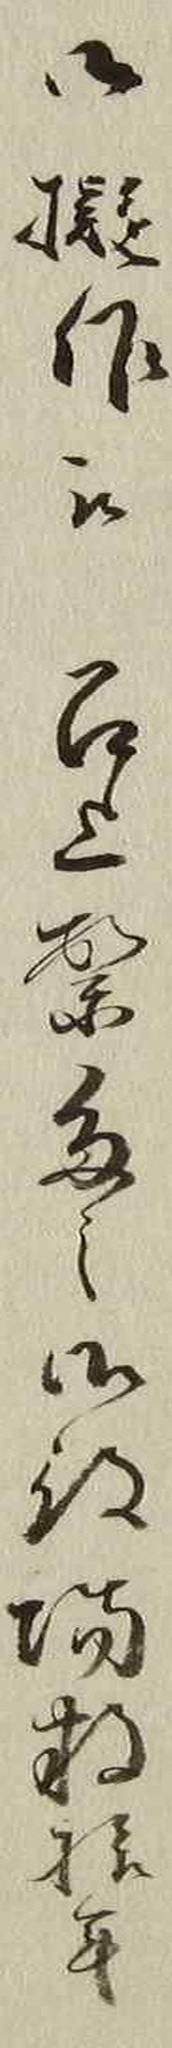御擬作被召上繁多之御役場数拾年
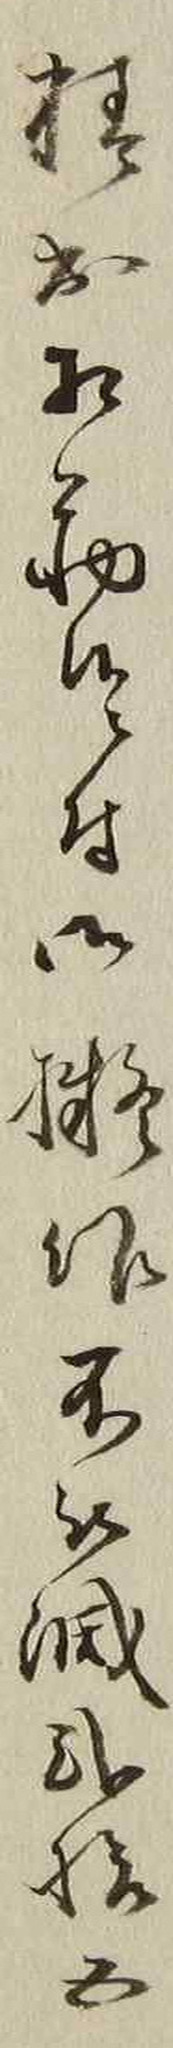精出相勤候ニ付御擬作不被減弐拾五
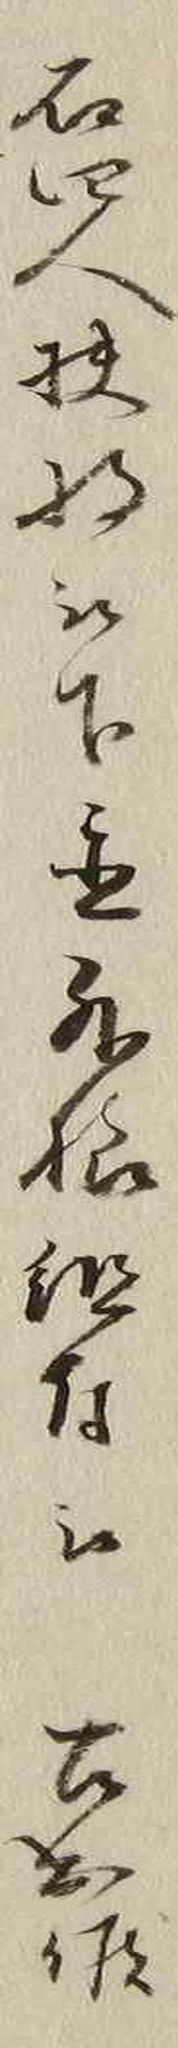石四人扶持被下置外様組付被召出候
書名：諸士系譜　巻之28　い之部28
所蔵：会津若松市立会津図書館
